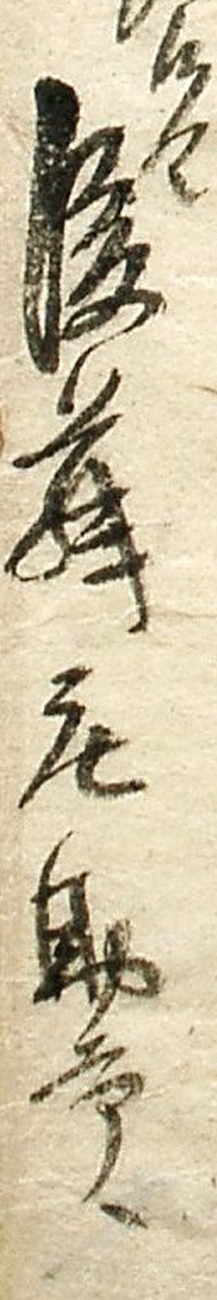後藤庄助方へ

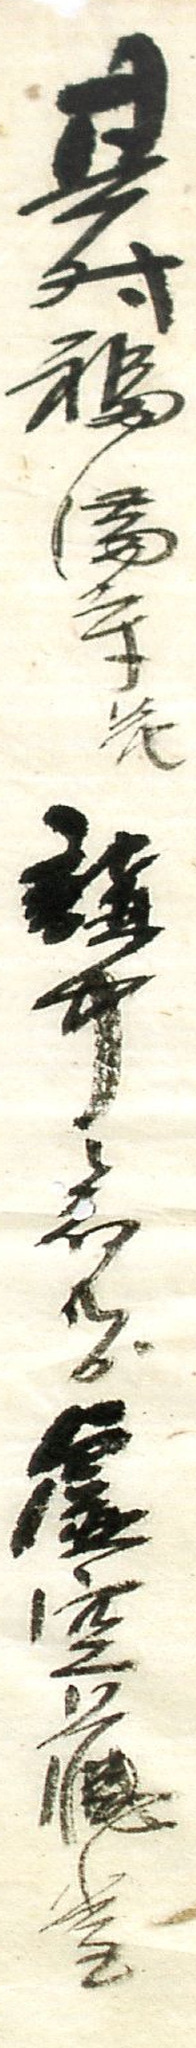其村福満寺幷講中之者共ゟ虚空蔵堂
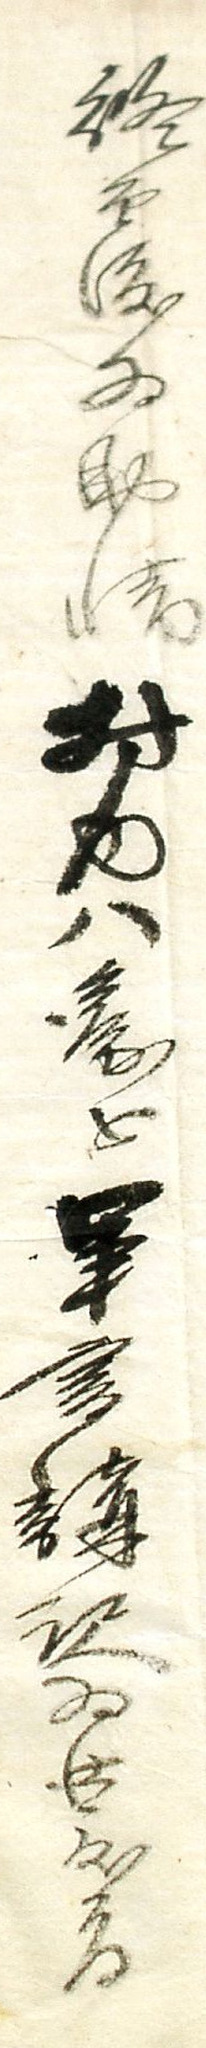修覆為助情村内八兵衛義軍書講釈為仕度旨
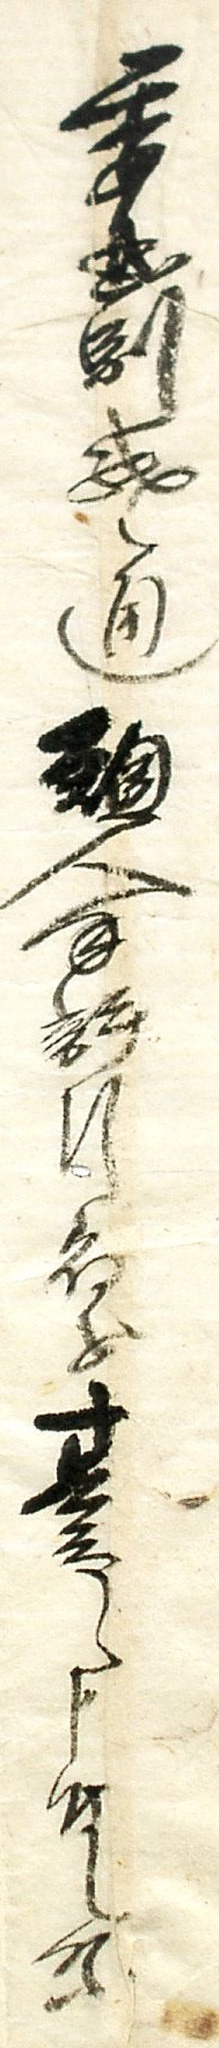委曲別紙之通願人手許行着義其方へ申付候条
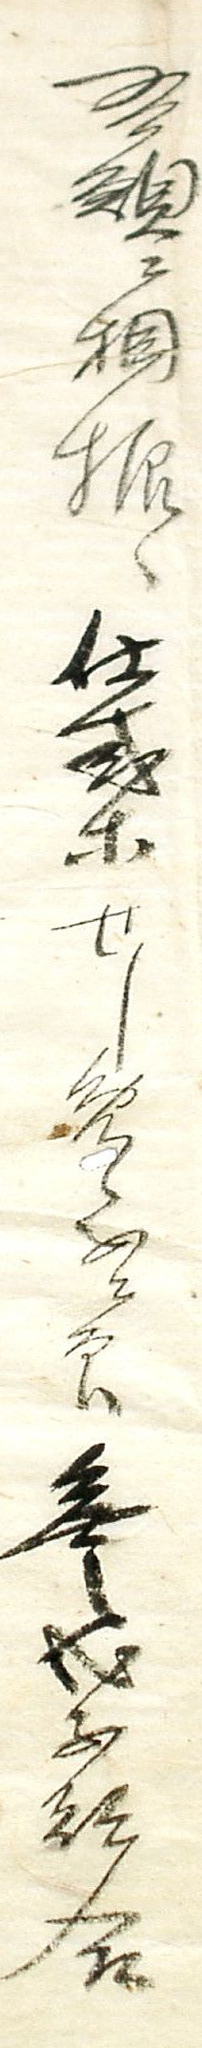右願ニ相振候仕成等せしめ候義ニ而ハ無之哉不都合
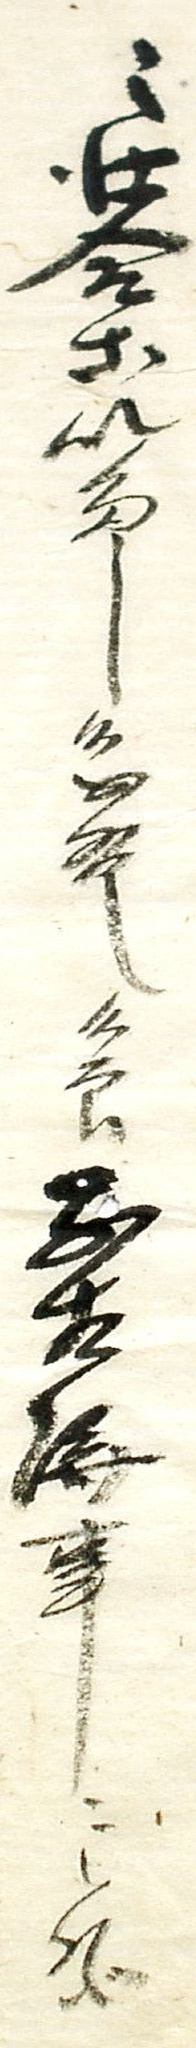之仕合等いたし候義有之候而ハ不相済事ニ候条
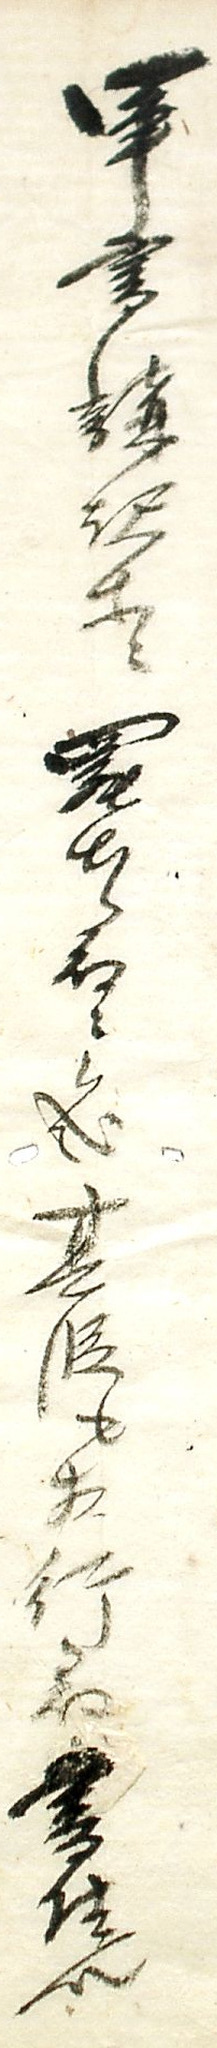軍書講釈等ニ罷出候者ニ候哉其段も相行着書付ヲ以
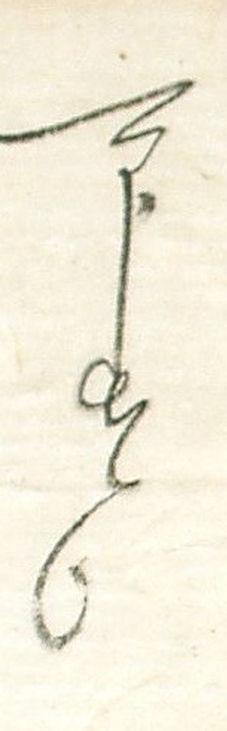可申出候以上
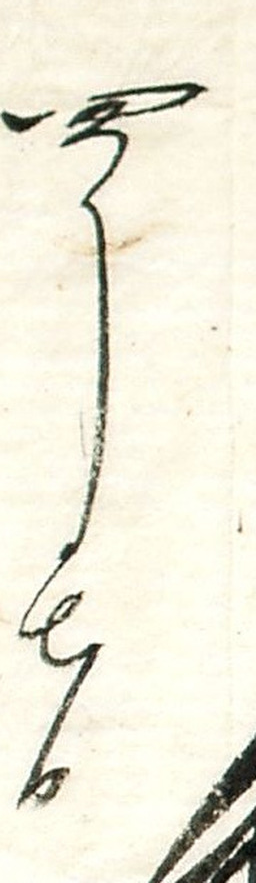四月七日
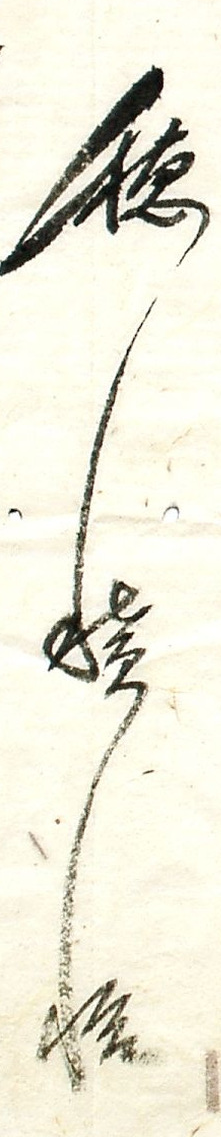穂積恰
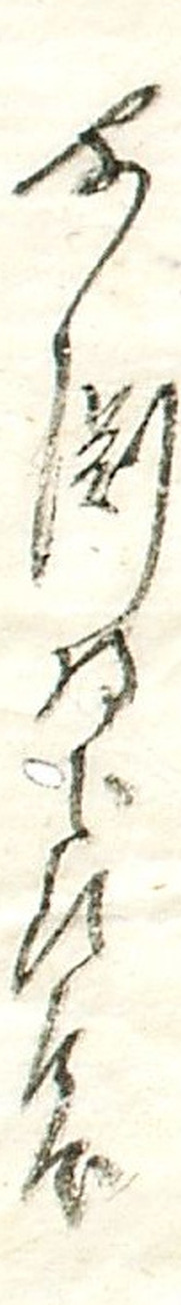早渕村与頭庄屋
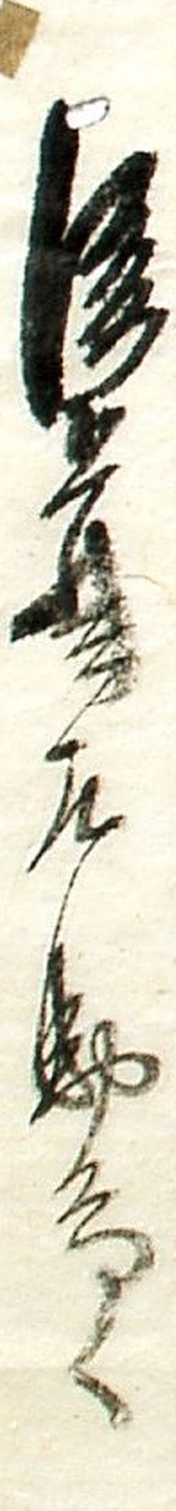後藤庄助方へ
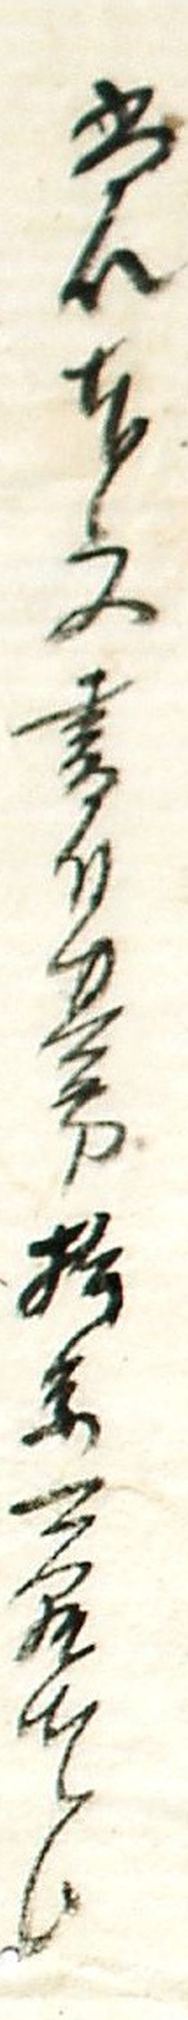尚以本文書付其方持参可罷出候以上
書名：（早渕村福満寺虚空蔵菩薩堂修復のためおどけ軍書講談願行着添え書控）
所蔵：鳴門教育大学 Naruto University of Education
